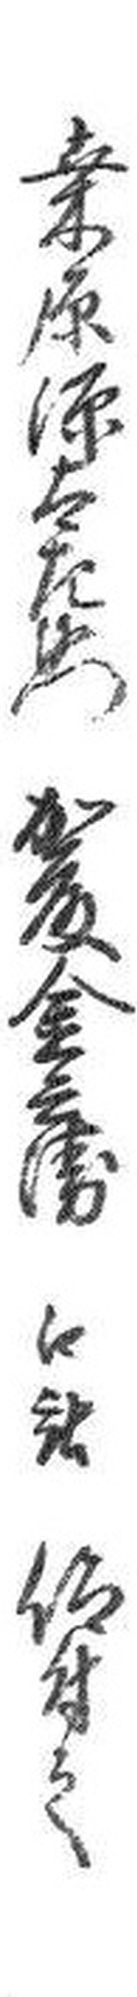桑原源太左衛門加藤金兵衛江被仰付之
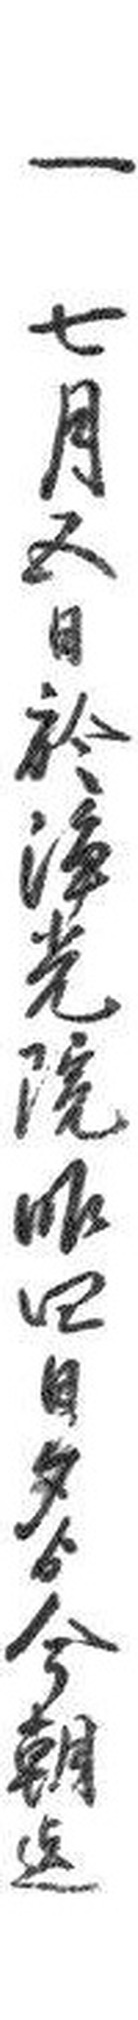一七月五日於浄光院昨四日夕方ゟ今朝迄
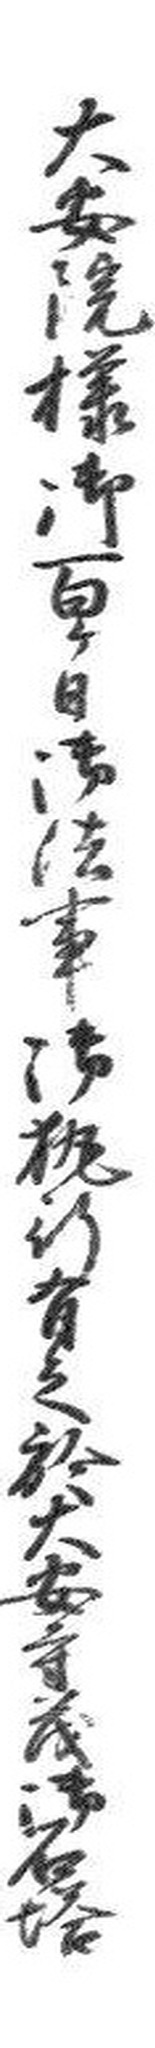大安院様御百ヶ日御法事御執行有之於大安寺茂御石塔
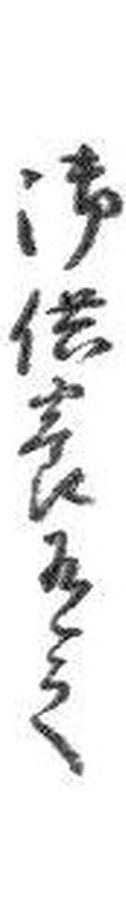御供養有之
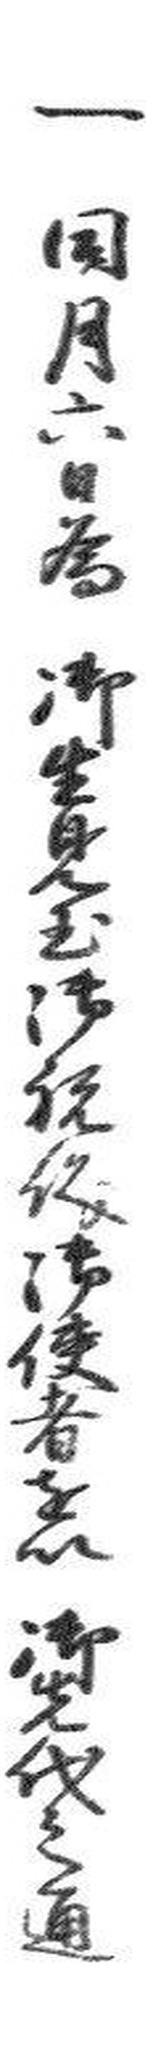一同月六日為御生身魂御祝儀御使者を以御先代之通
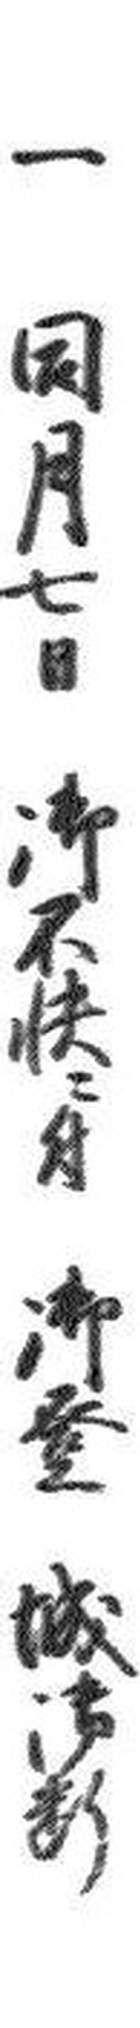一同月七日御不快ニ付御登城御断
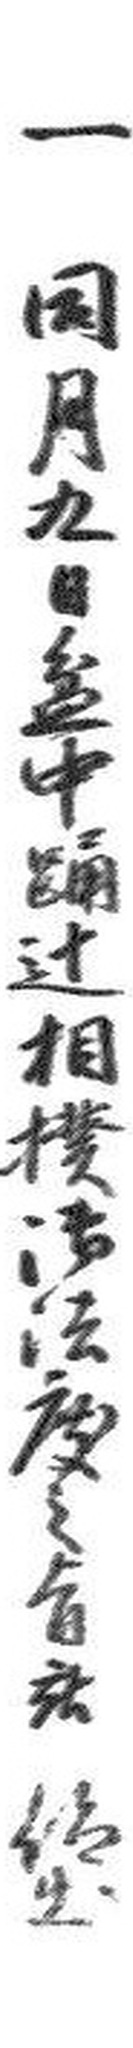一同月九日盆中踊辻相撲御法度之旨被仰出
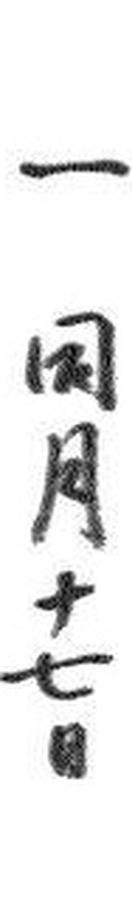一同月十七日
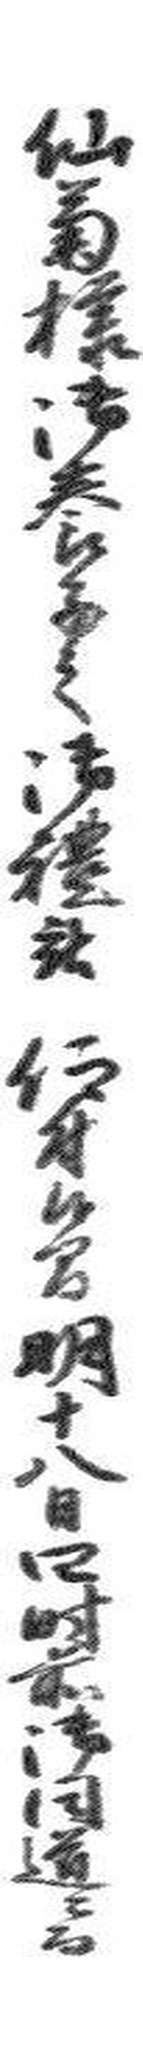仙菊様御養子之御礼被仰付候間明十八日四時前御同道ニ而
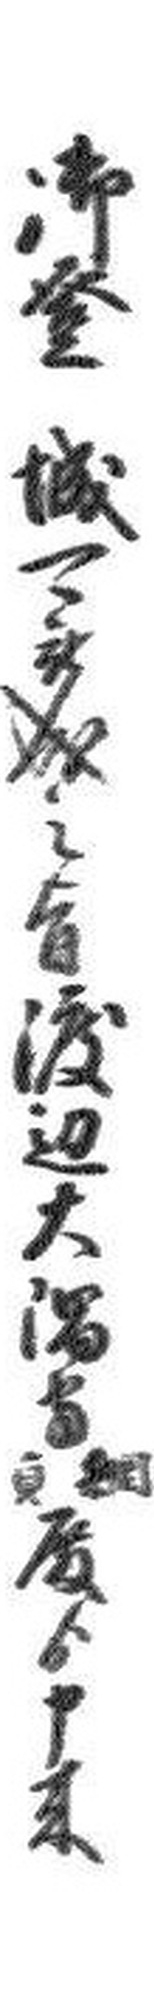御登城可被成之旨渡辺大隅守綱貞殿ゟ申来
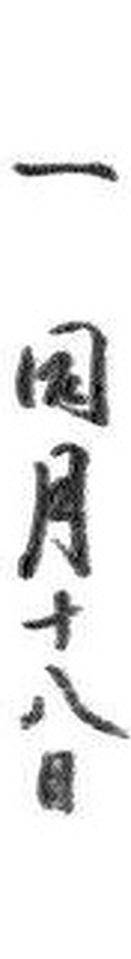一同月十八日
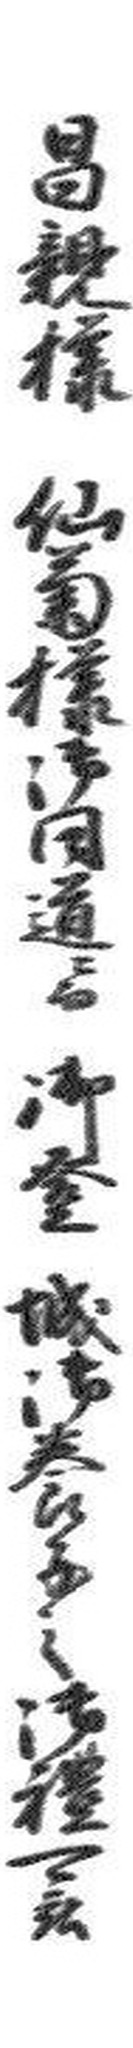昌親様仙菊様御同道ニ而御登城御養子之御礼可被
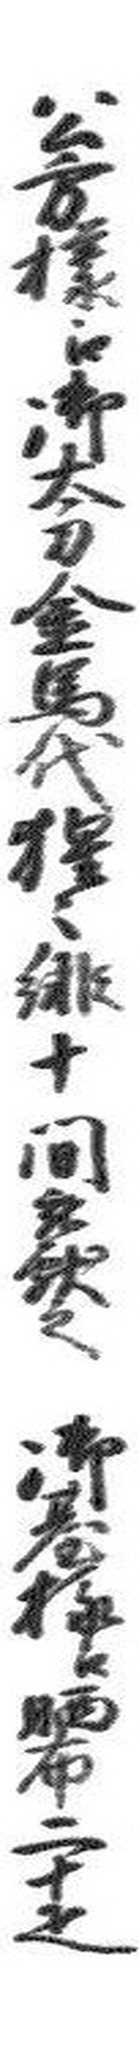公方様江御太刀金馬代猩々緋十間被献之御台様江晒布二十疋

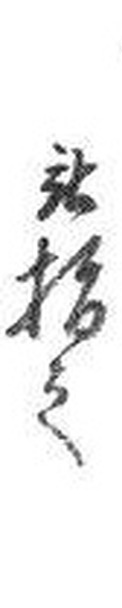被指之
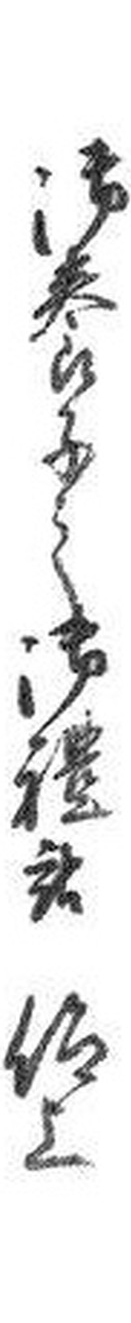御養子之御礼被仰上
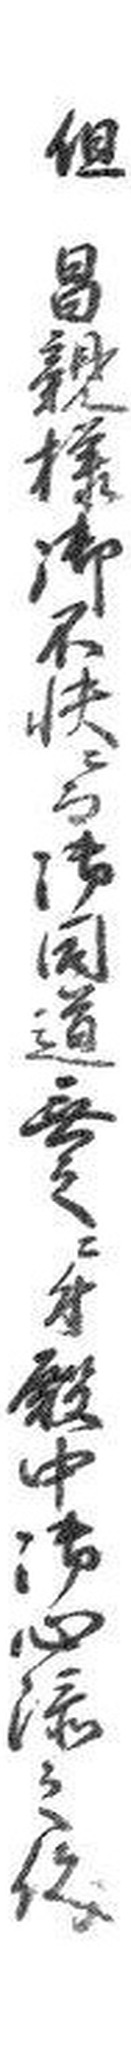但昌親様御不快ニ而御同道無之ニ付殿中御心添之儀
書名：家譜 十一 昌親公 従延宝二年到延宝四年八月
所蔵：福井県文書館 Fukui Prefectural Archives
